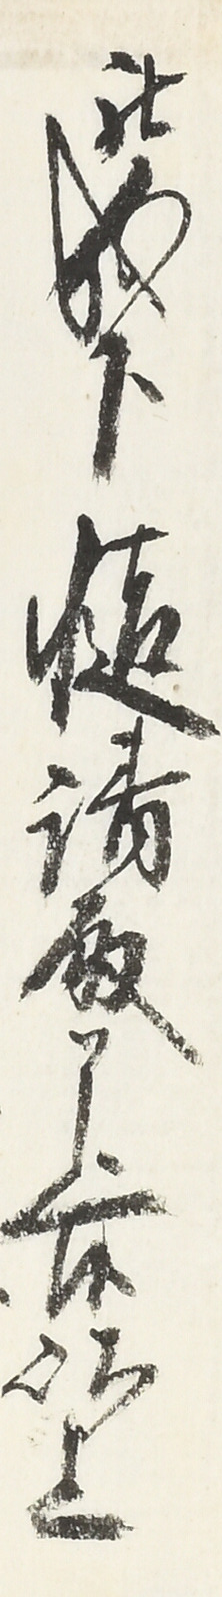被成下慥請取申上候以上
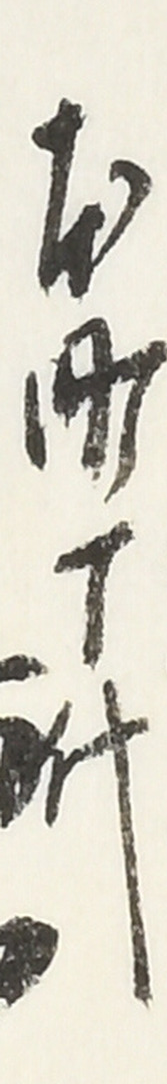本町丁代
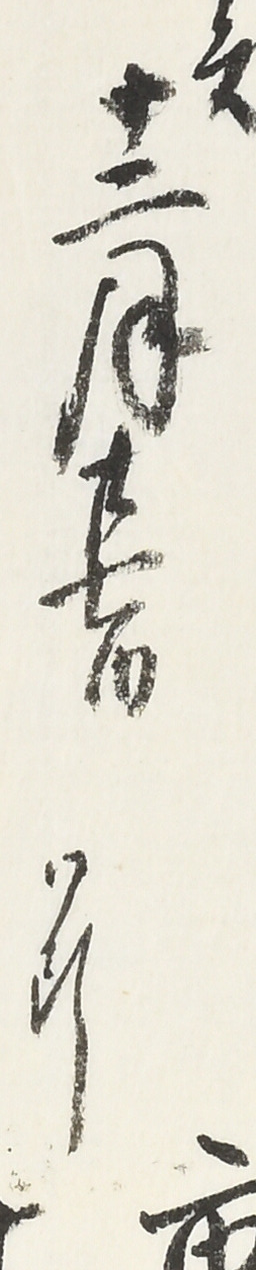十二月廿七日同断
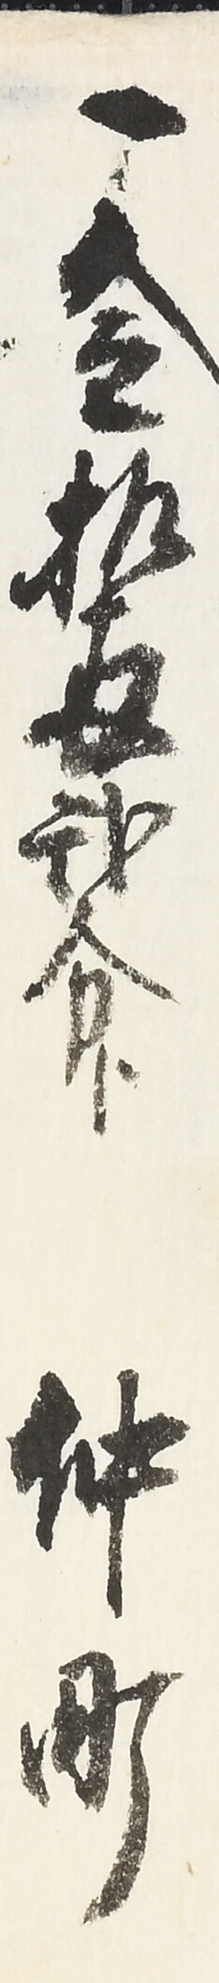一金拾両弐分ト仲町
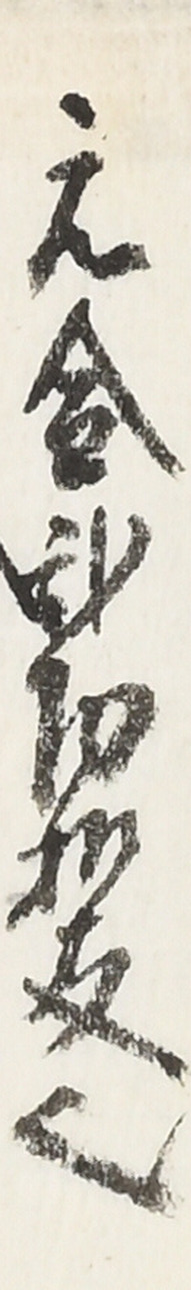元金弐百拾両也
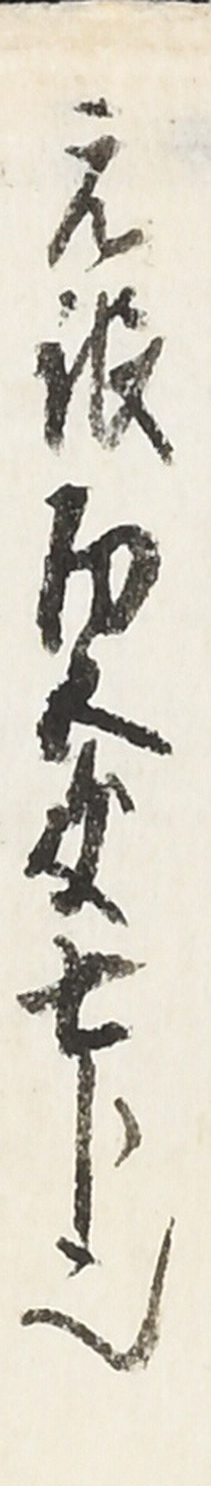元銀百五匁七分也
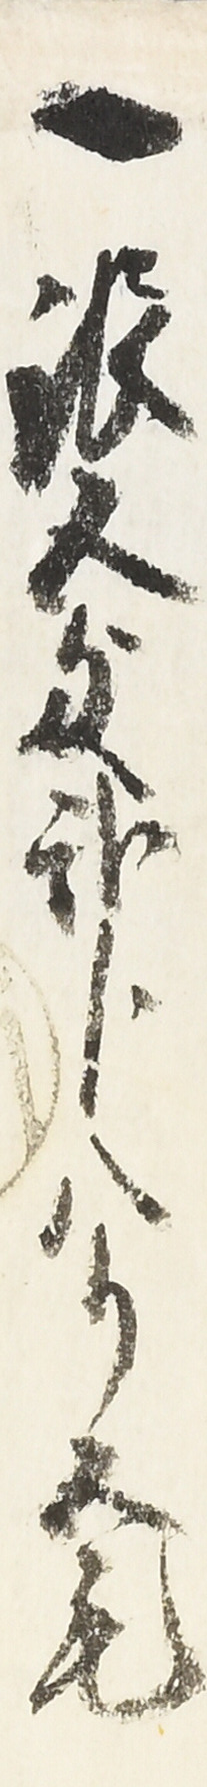一銀五匁弐分八厘五毛
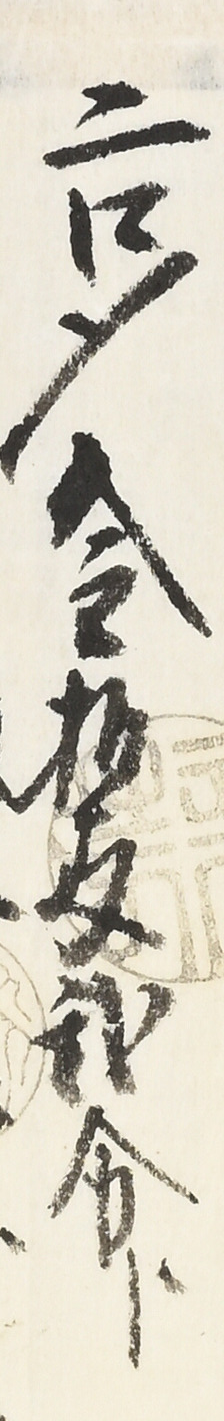二口〆金拾両弐分ト
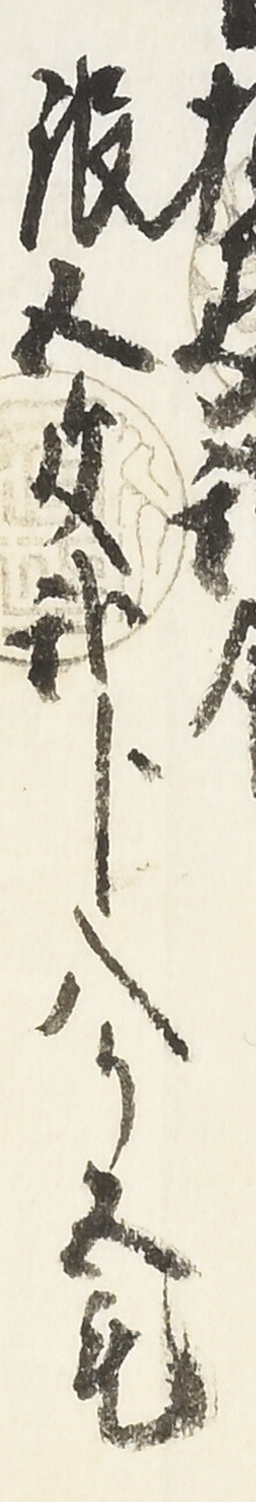銀五匁弐分八厘五毛
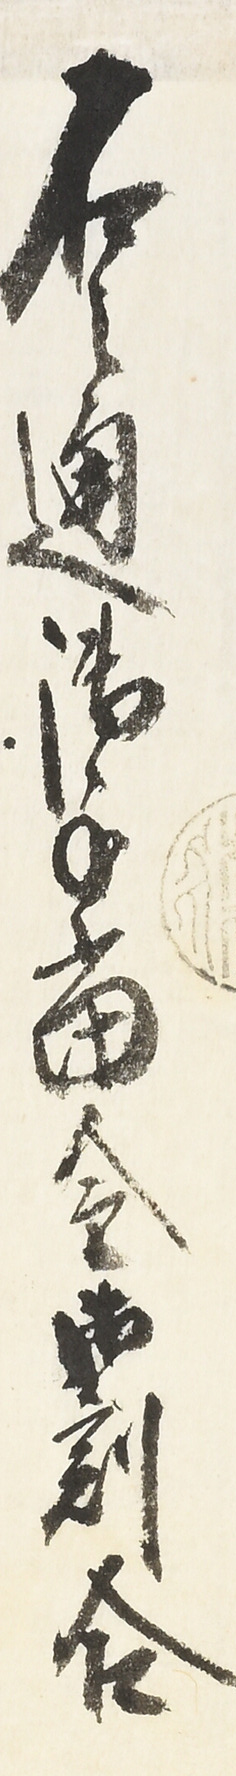右之通御手当金御割合
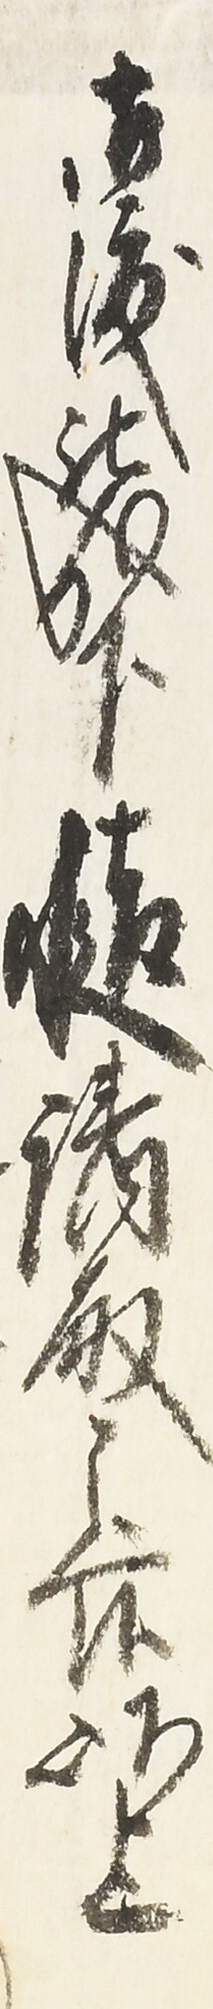御渡被成下慥請取申上候以上
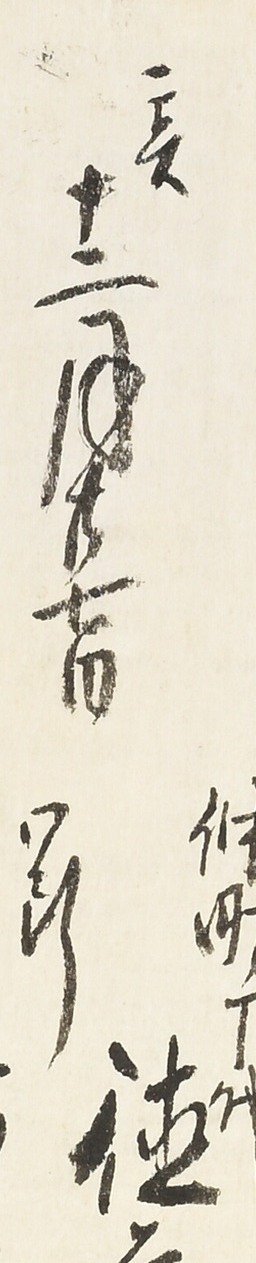十二月廿七日同断
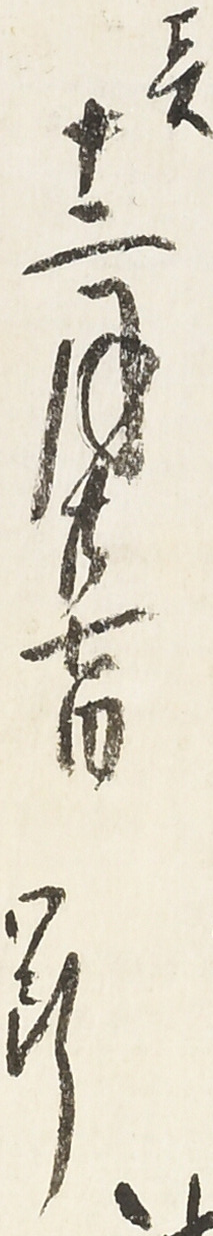十二月廿七日同断
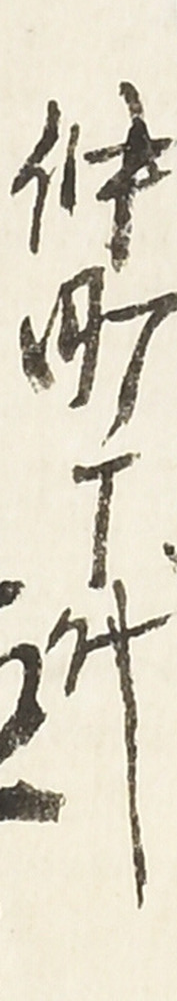仲町丁代
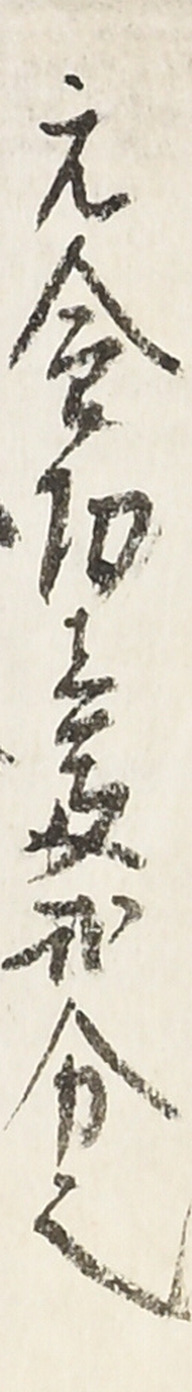元金百壱両弐分也
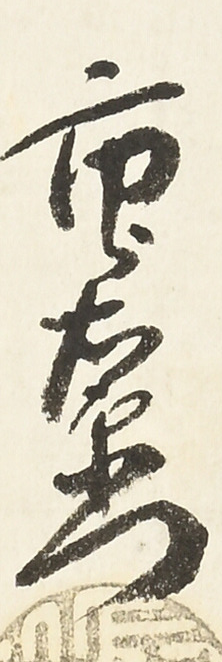市郎右衛門
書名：御才覚金御利足割渡扣帳
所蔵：伊那市立高遠町図書館・合同会社AMANE
